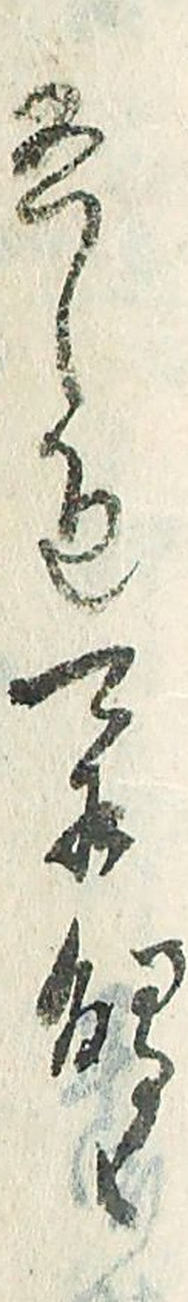右之通可相触候
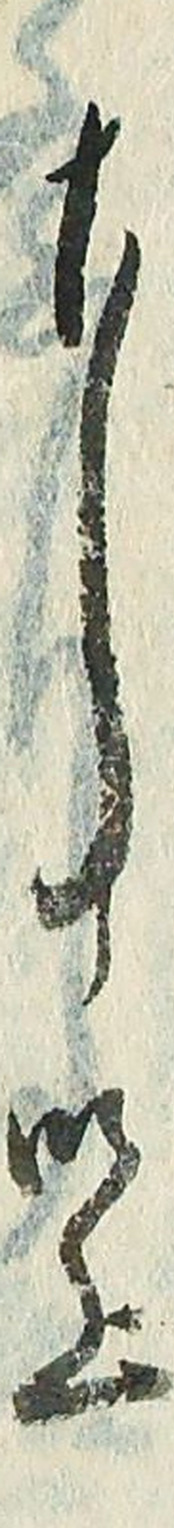十月以上
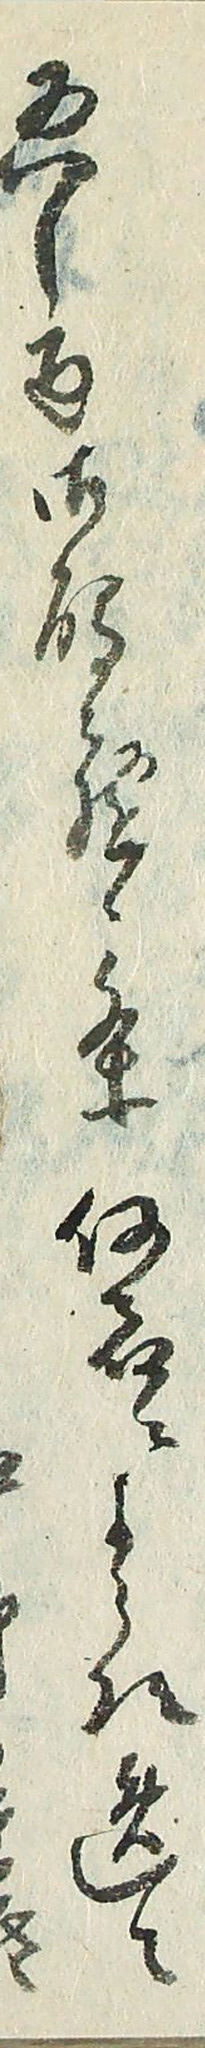右之通御触被為遊候条何者によらす逸々
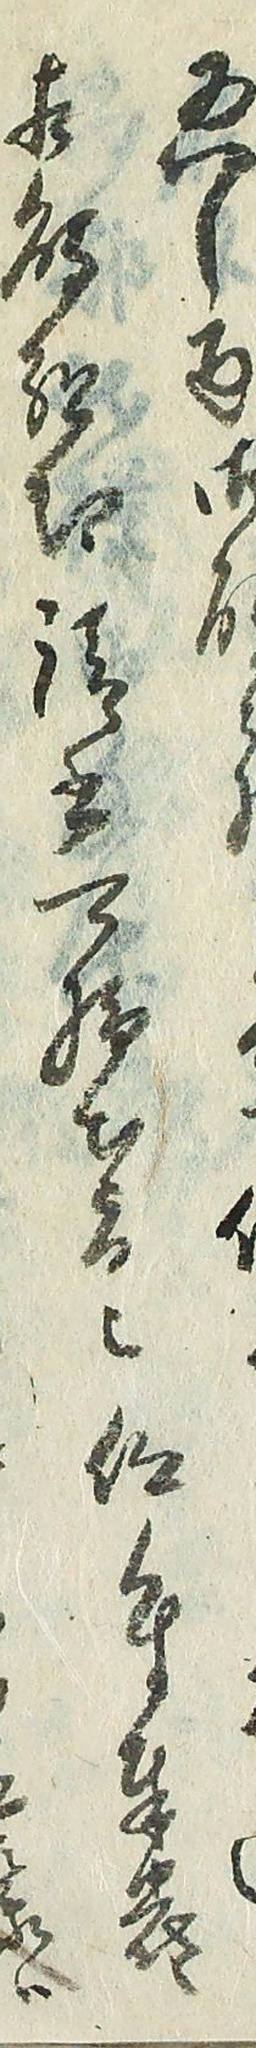相触組切請書可指出旨被仰付奉畏候
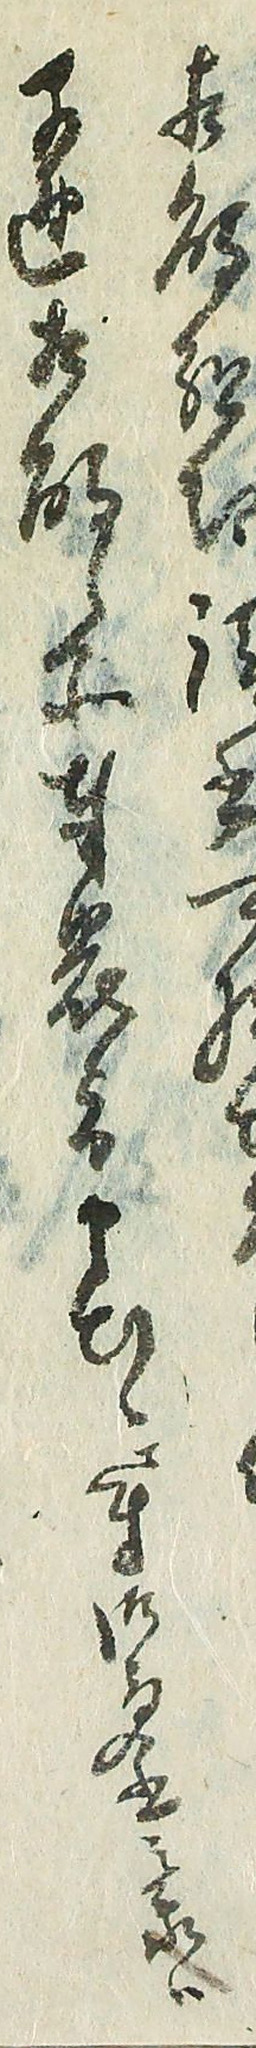早速相触候所奉畏旨申出候に付御受書之義は
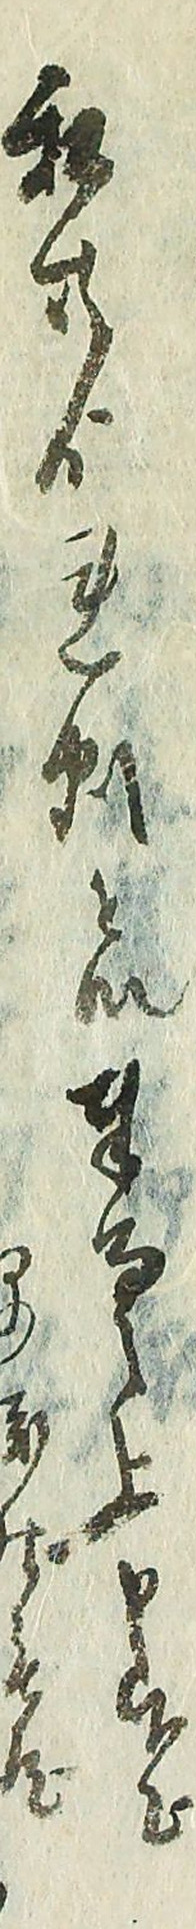私共ゟ連判を以奉差上申候以上
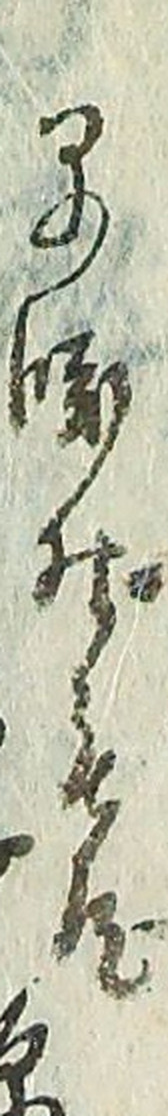早淵村庄屋
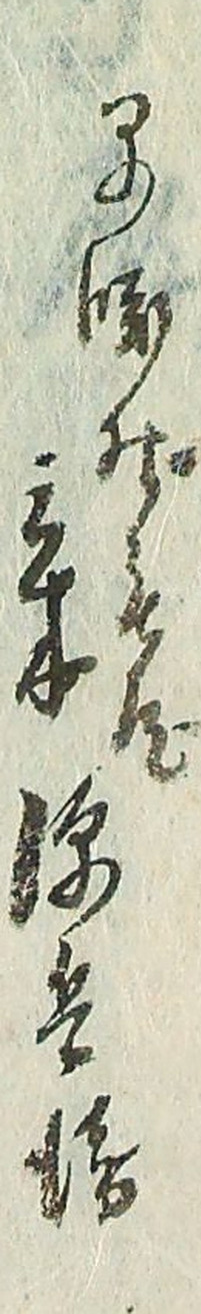早淵村庄屋
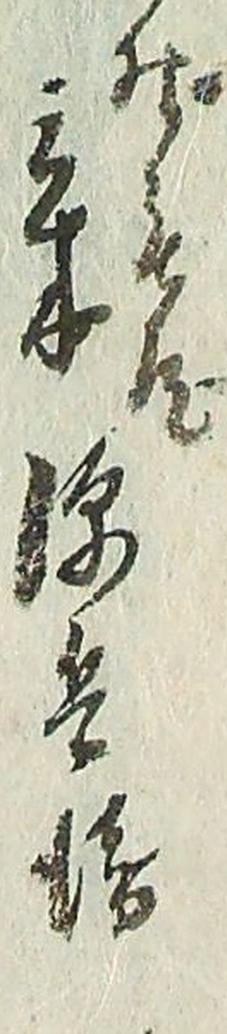三木源兵衛
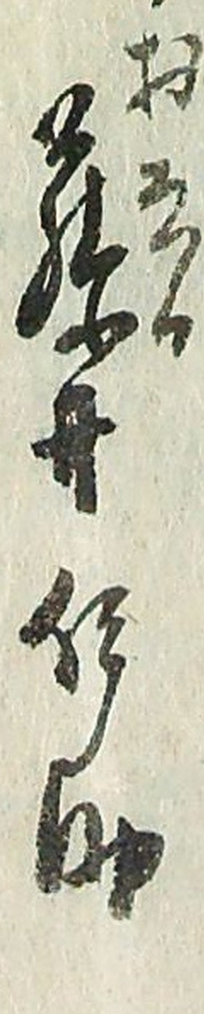藤井伊助
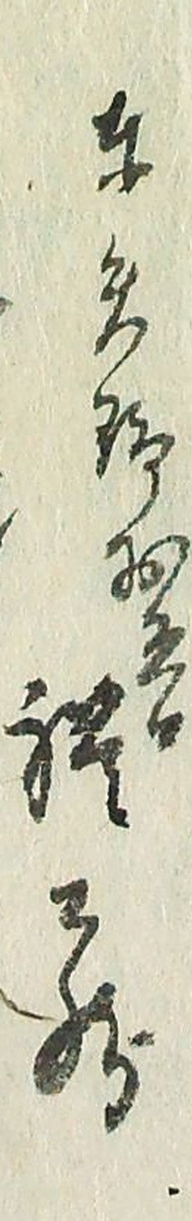東矢野村右同
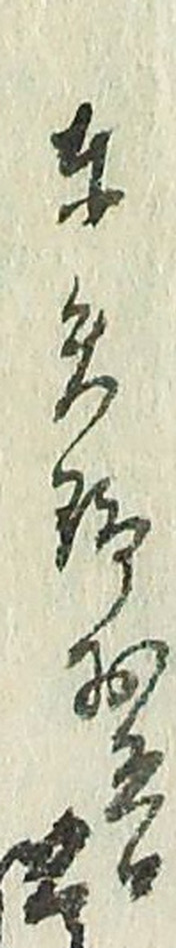東矢野村右同
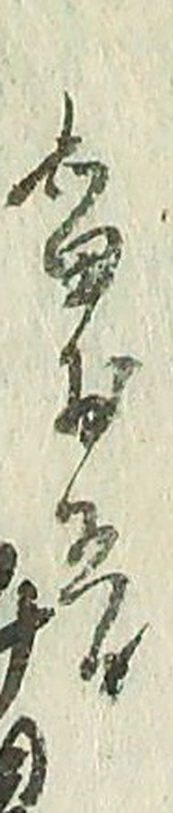和田村右同
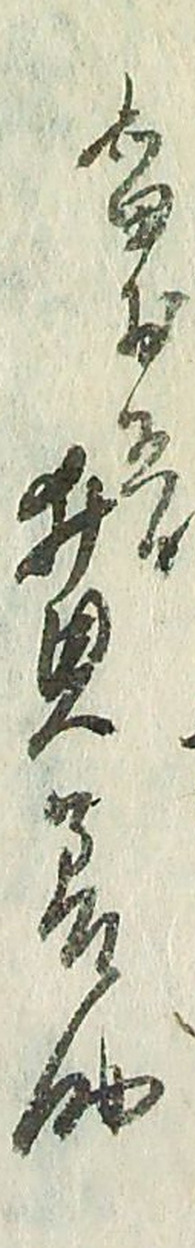井貝善助
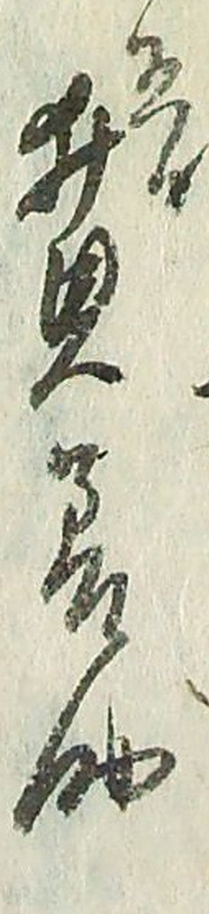井貝善助
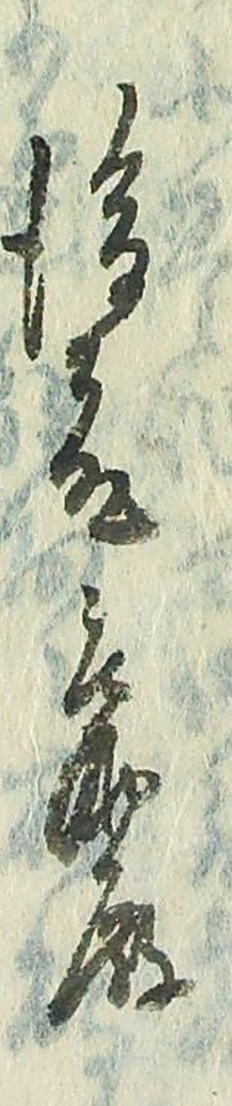後藤庄助殿
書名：諸御用御□受書控
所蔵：鳴門教育大学 Naruto University of Education
